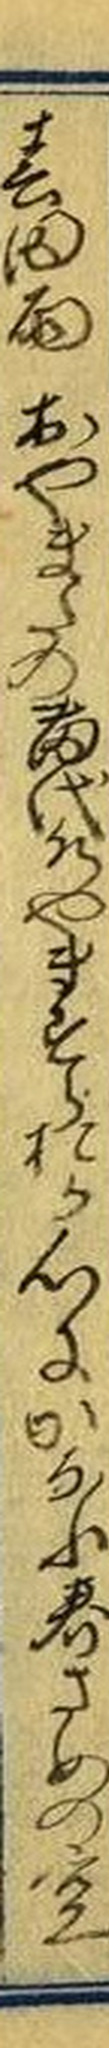おやまたの苗代水やますらおか心にかなふ春さめの空
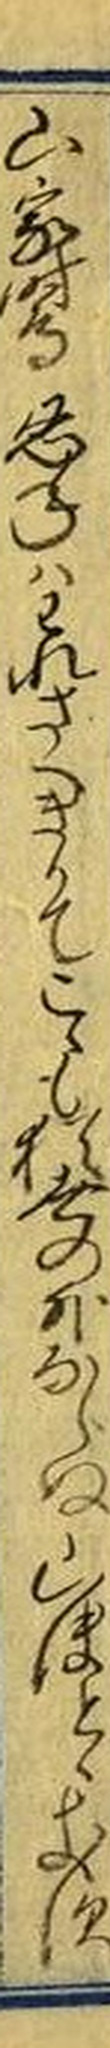忍ねはわれさへきかてこゝも猶世の外ならぬ山ほとゝきす
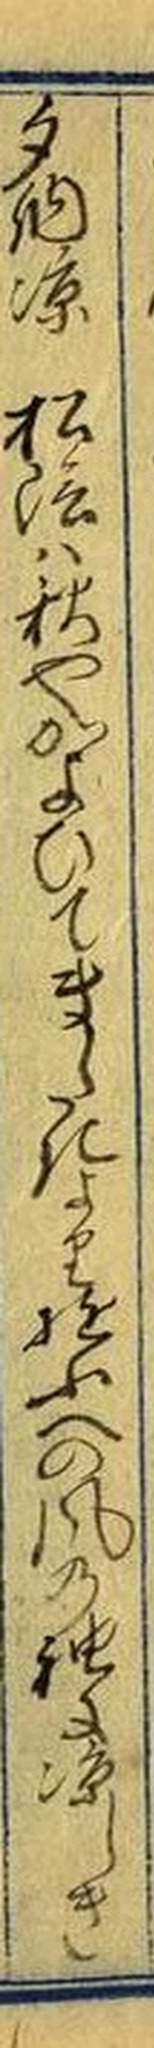松陰は秋やかよひてまたきよりゆふへの風の袖に涼しき
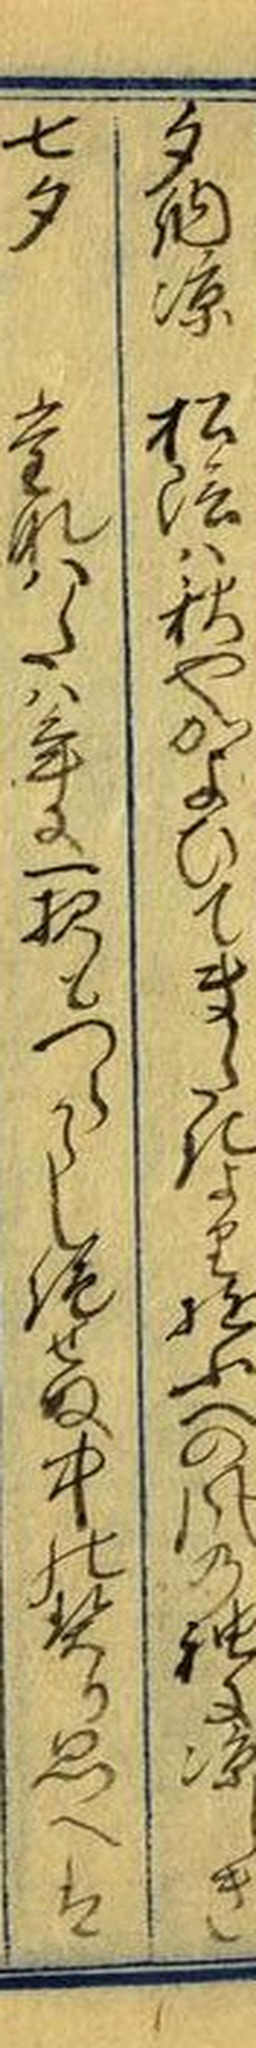たなはたは年に一夜もつらからし絶せぬ中の契り思へは
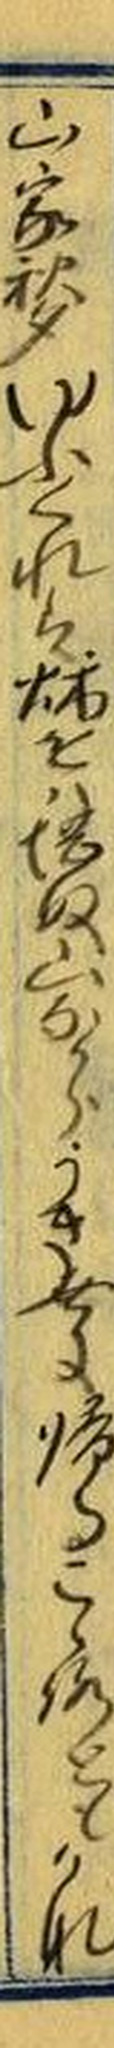ゆふくれは秋をは堪ぬ山なからうき世に帰るこゝろともかな
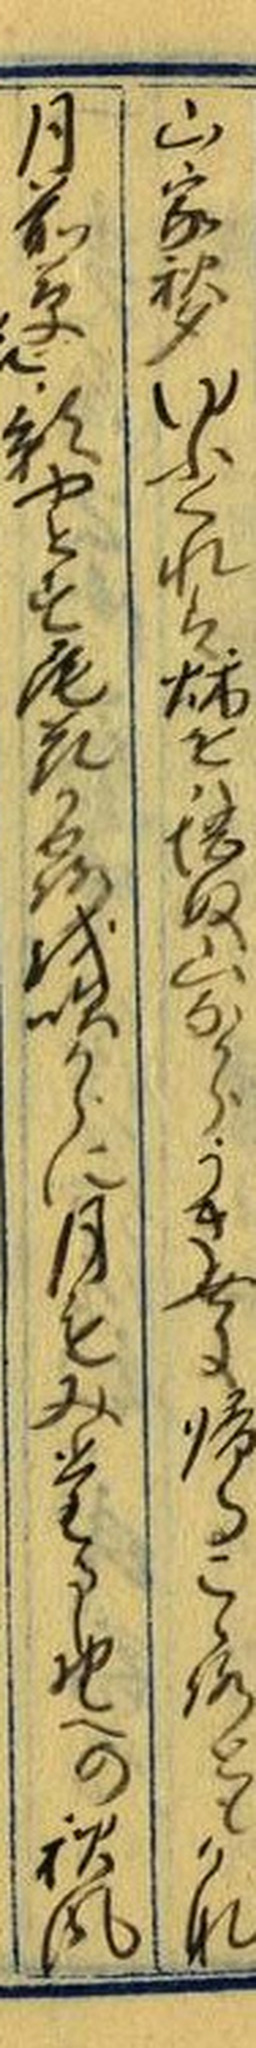影やとす尾花か露を吹からに月もみたるし野への秋風
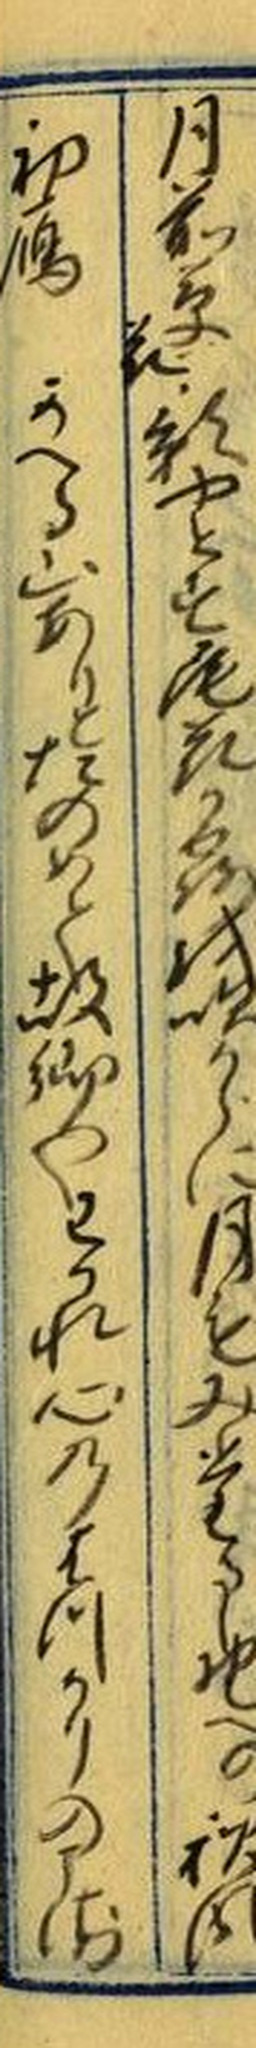かへる山ありとたのめて故郷やわかれ心のはつかりのこゑ
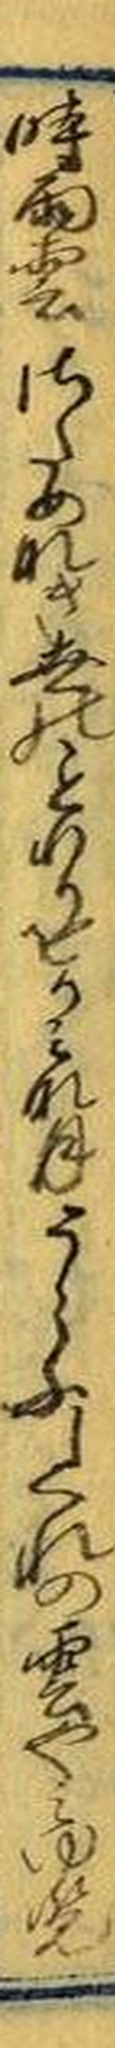さためなき世のことわりをかみな月うらふしくれの雲やみゆ覧
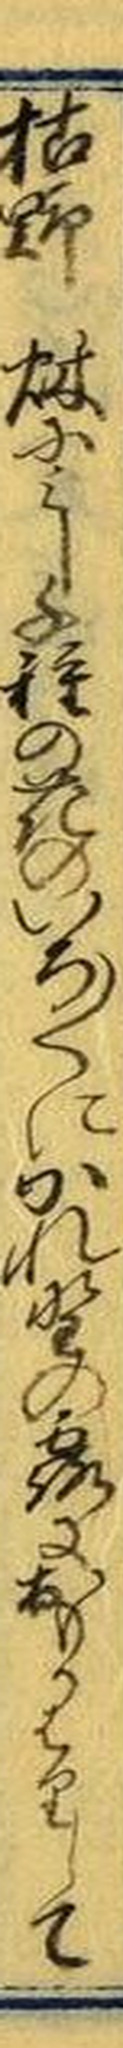秋にみし千種の花のいろ〳〵にかれ野の露におもかはりして
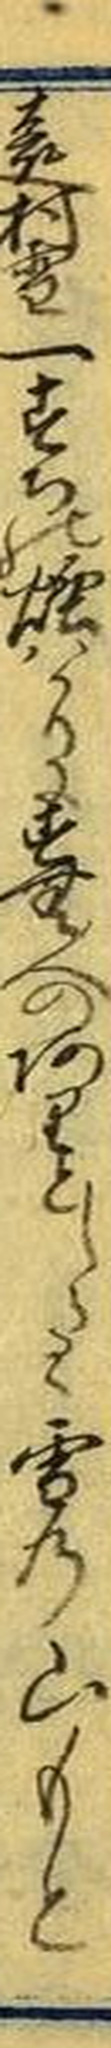一すちの煙はかりにすむ人のありとしらるゝ雪の山もと
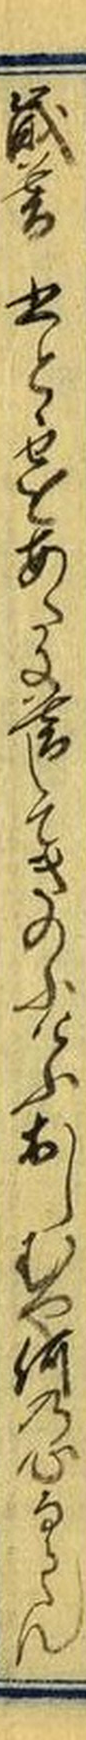出とせをあたに暮してきのふけふおしむや何の心なるらん
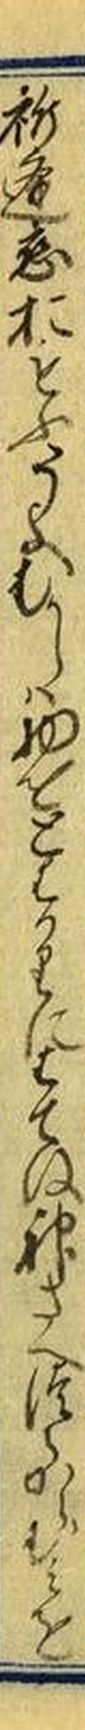おもふそよむかしは物をとはかりにはてぬ神さへつらからむみを
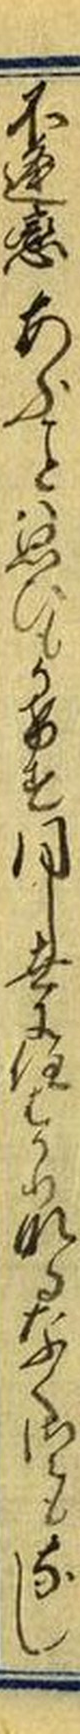あふことは思ひもかけす同し世に住むかりなるなくさみもなし
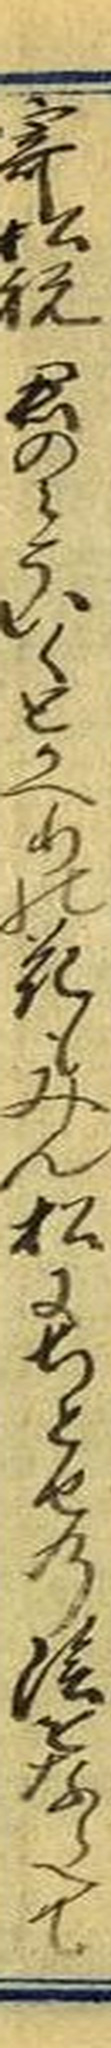君のみそいくとかへりの花もみん松にちとせの陰をならへて
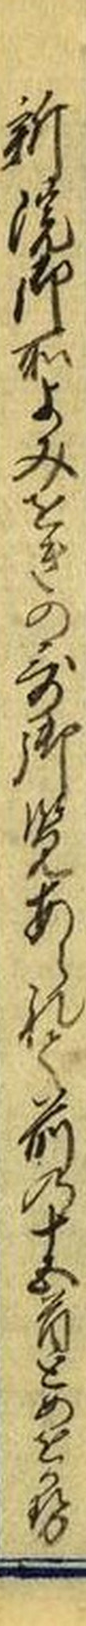新院御所よみをきの哥御覧あられて前の十五首とめをかせ
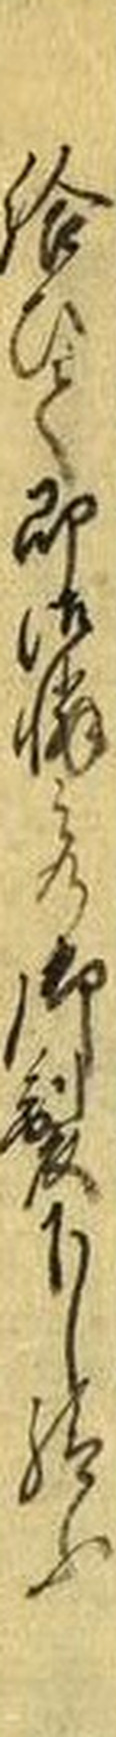給ひて即御憐みの御製下し給ふ
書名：温古集 三巻
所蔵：福井県文書館 Fukui Prefectural Archives
